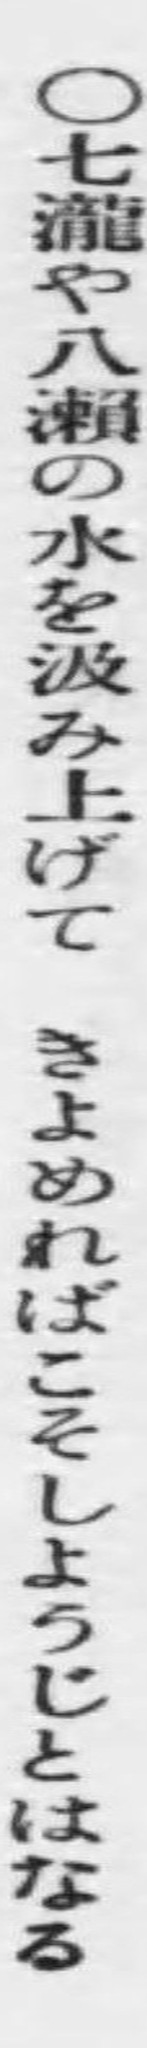○七瀧や八瀨の水を汲み上げてきよめればこそしようじとはなる
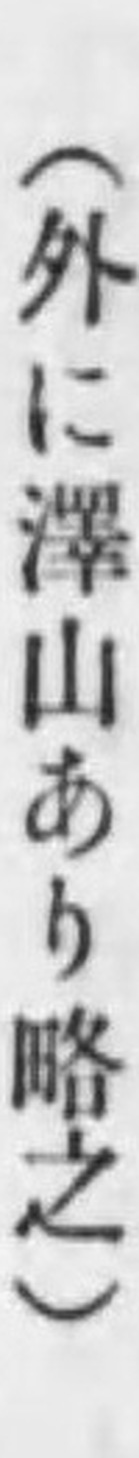(外に澤山あり略之)
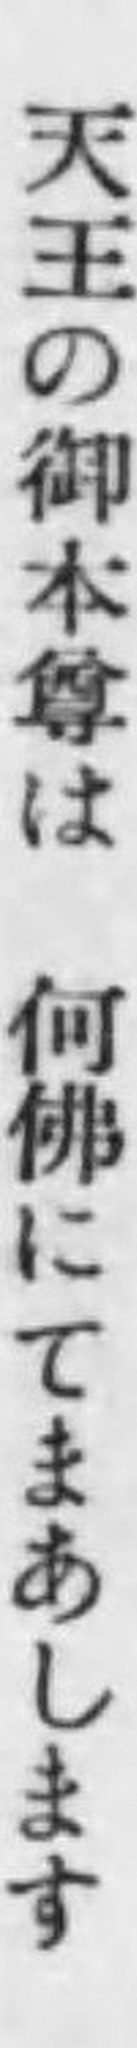天王の御本尊は何佛にてまあします
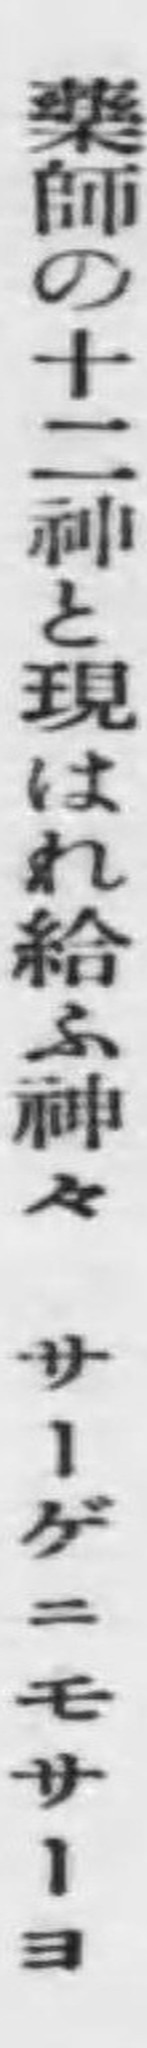藥師の十二神と現はれ給ふ神々サーゲニモサーヨ
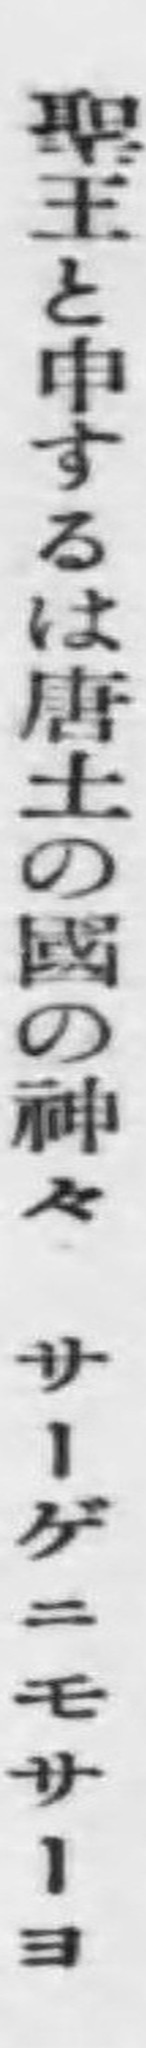聖王と申するは唐土の國の神々サーゲニモサーヨ
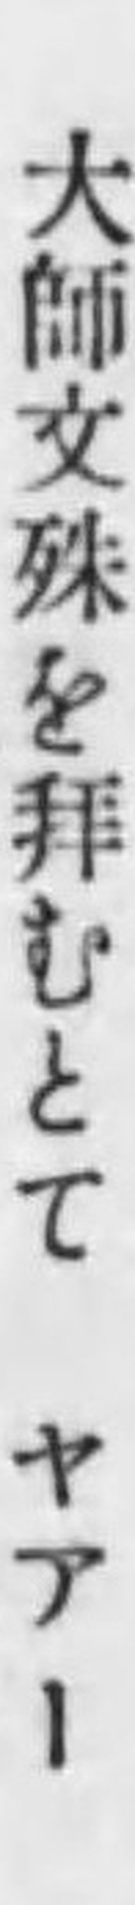大師文殊を拜むとてヤアー
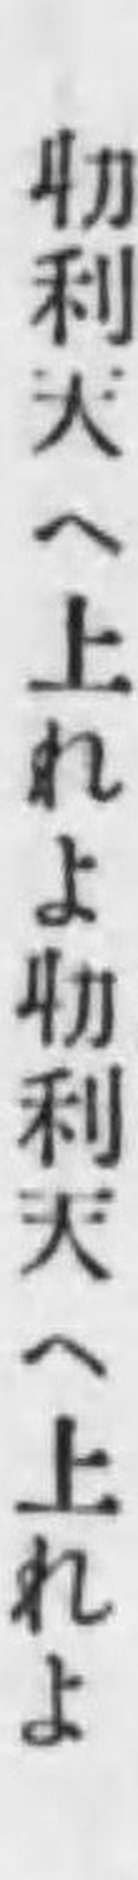忉利天へ上れよ忉利天へ上れよ
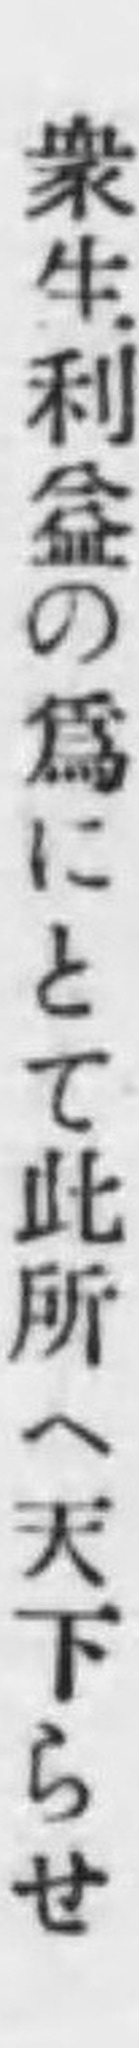衆生利益の為にとて此所へ天下らせ
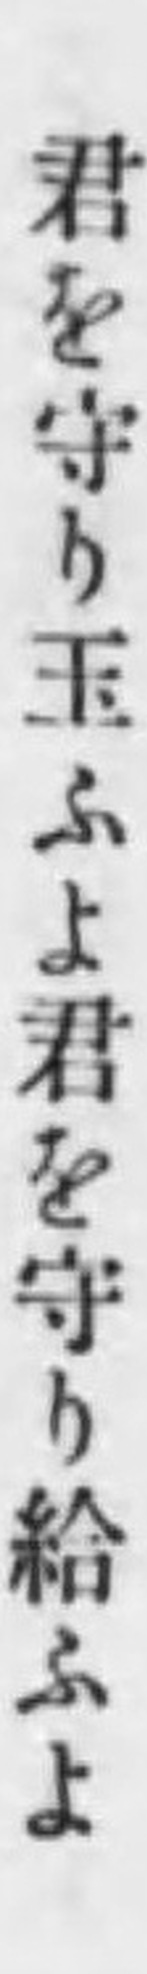君を守り玉ふよ君を守り給ふよ
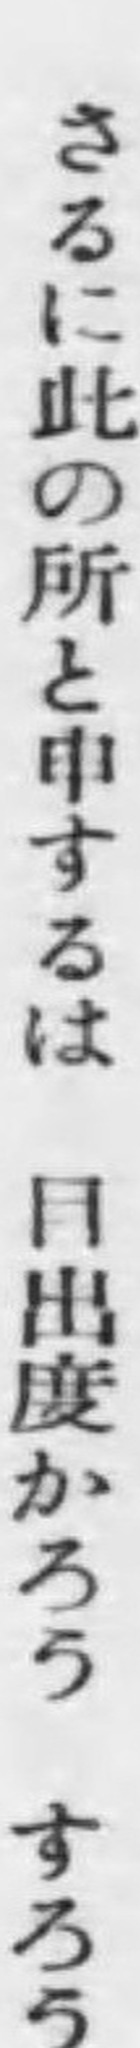さるに此の所と申するは目出度かろうすろう
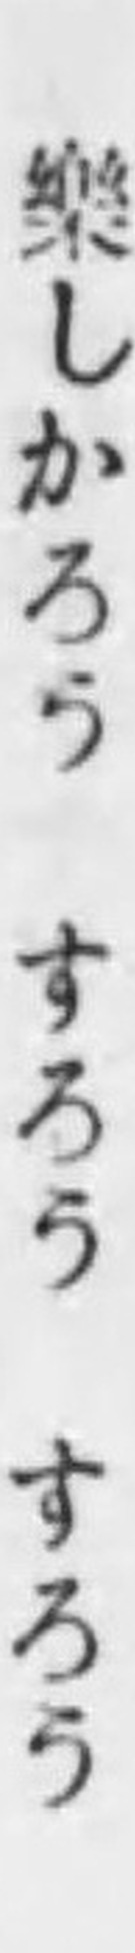樂しかろうすろうすろう
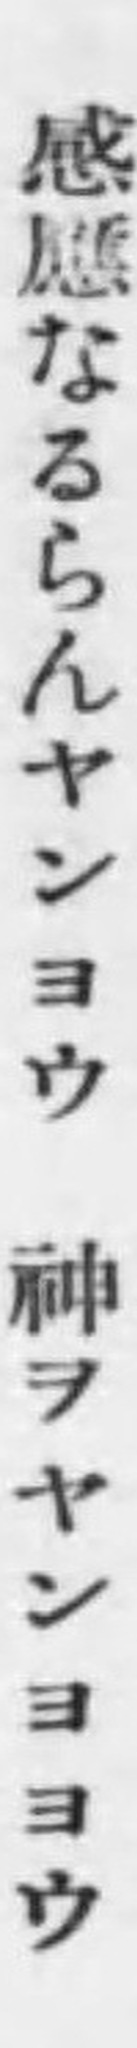感應なるらんヤンヨウ神ヲヤンヨヨウ

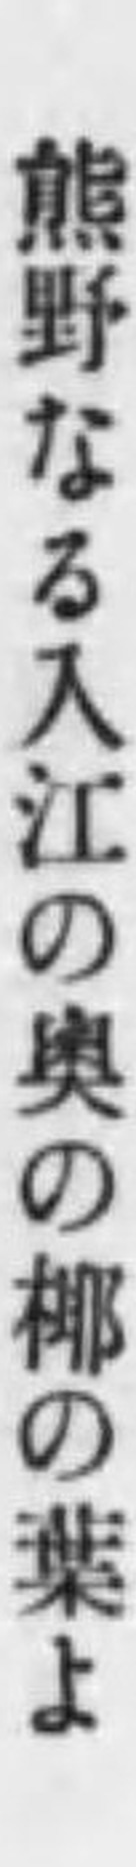熊野なる入江の奥の椰の葉よ
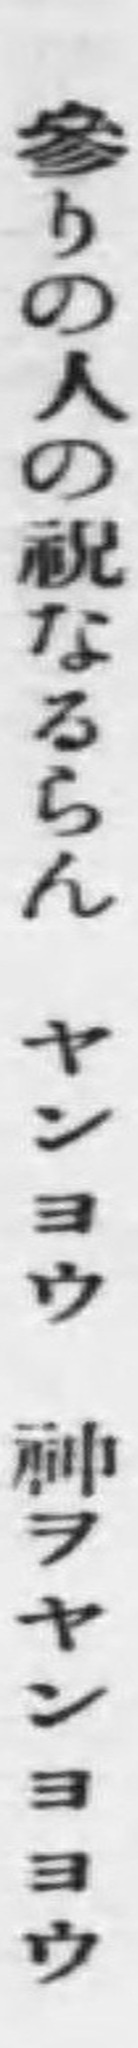參りの人の祝なるらんヤンヨウ神ヲヤンヨヨウ
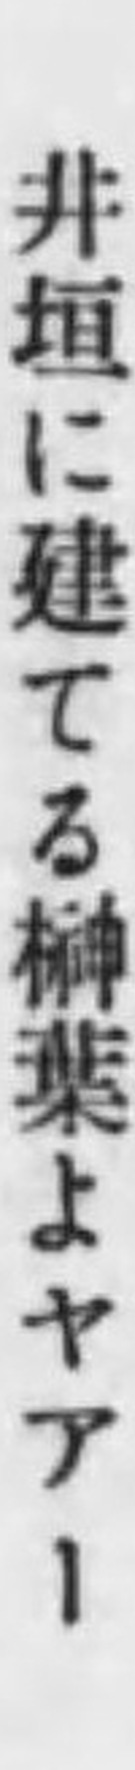井垣に建てる榊葉よヤアー
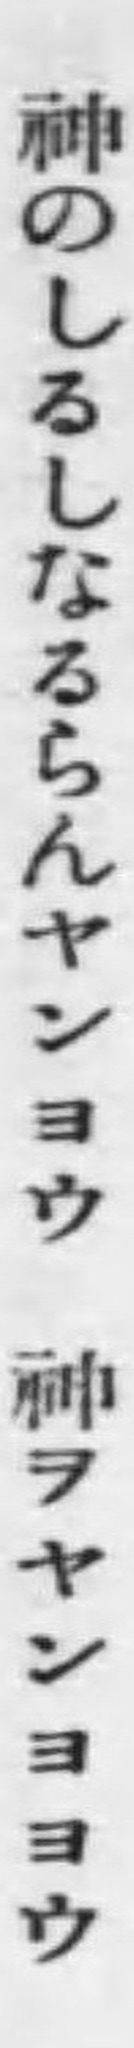神のしるしなるらんヤンヨウ神ヲヤンヨヨウ
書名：東三河道中記 : 豊橋市及其附近案内
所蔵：国立国会図書館 National Diet Library, JAPAN
